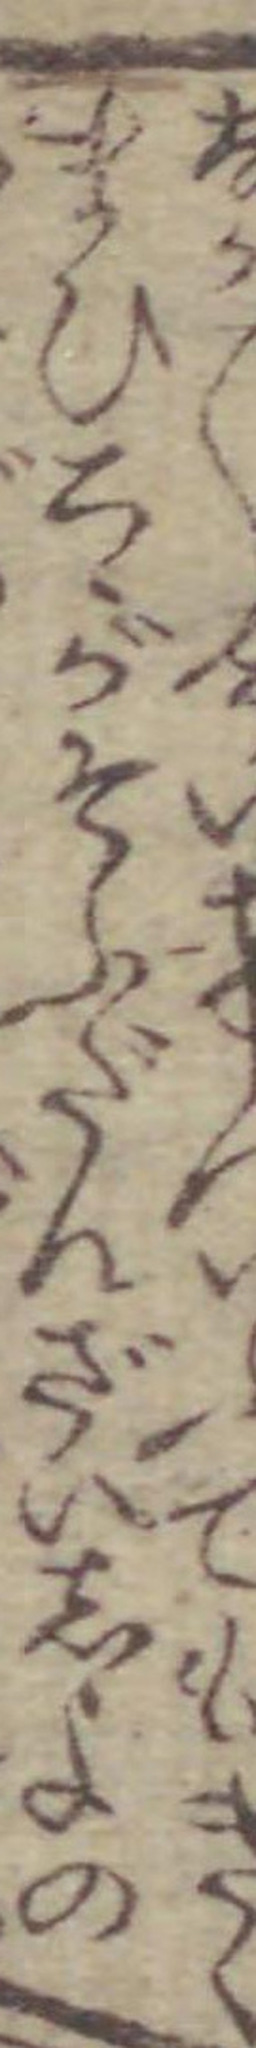まひこゝがそふだんざいしよの
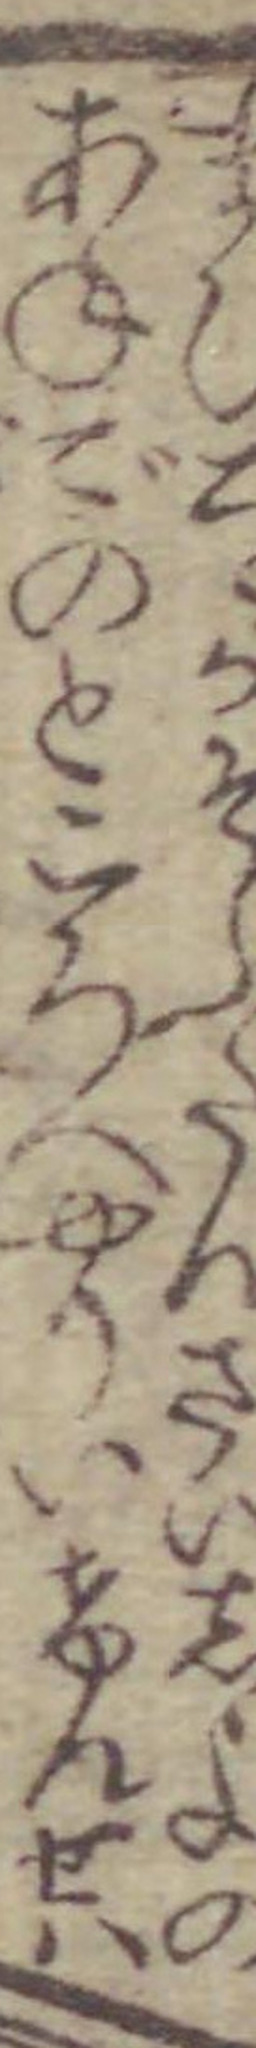あねごのところへやりいけんせは
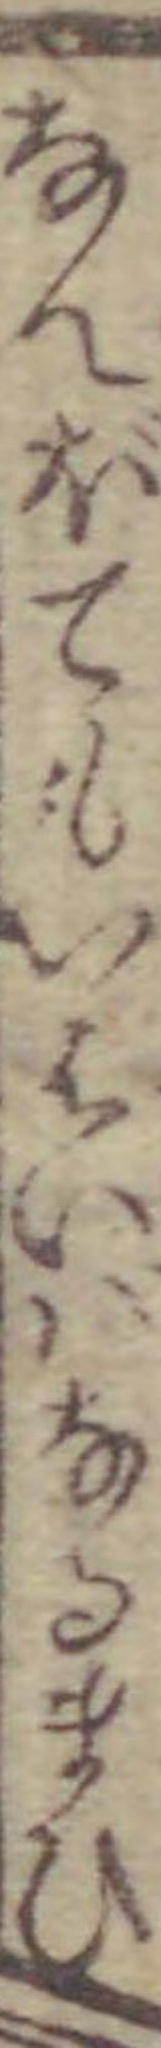なんぼてもいはいはなるまひ
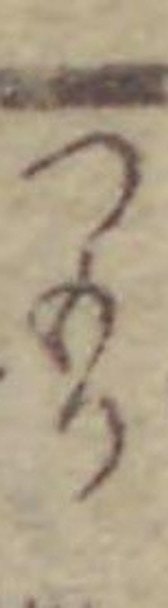つもり
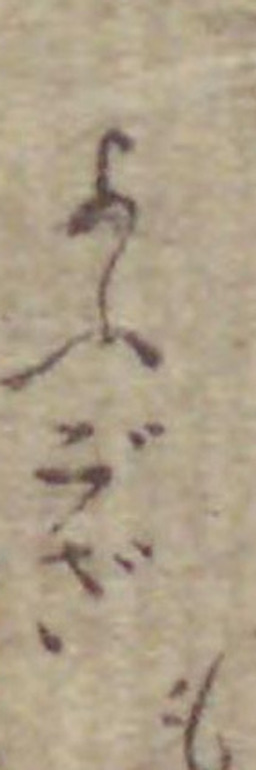よふござ
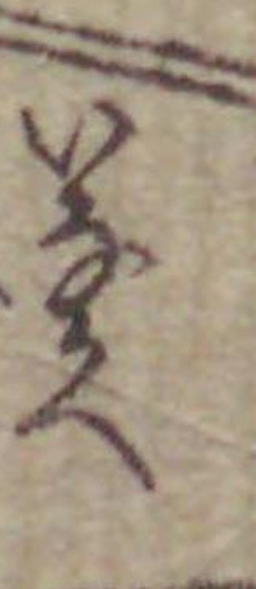いなかへ
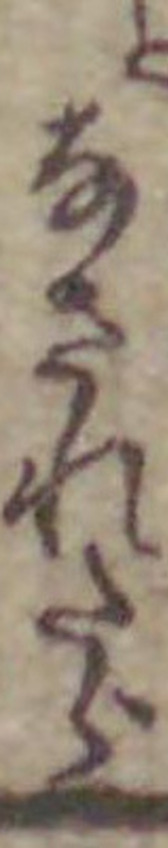なされたら
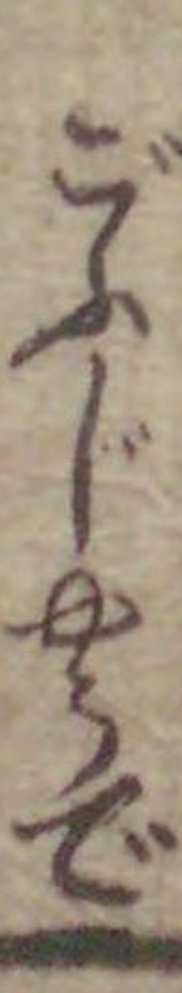ごふじやうで
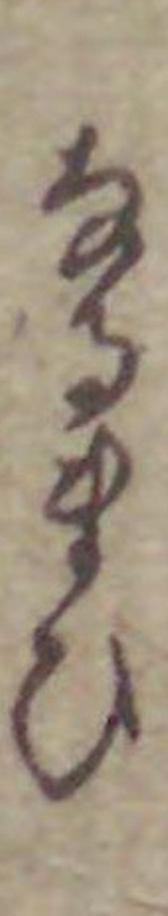なるまひ
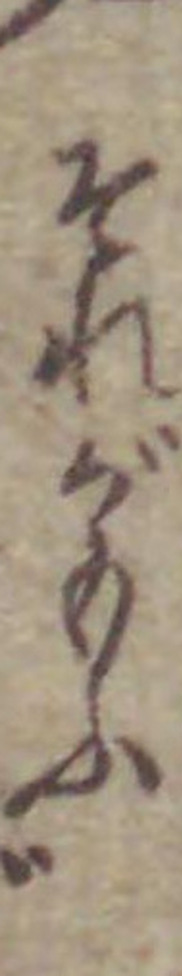それがもふ
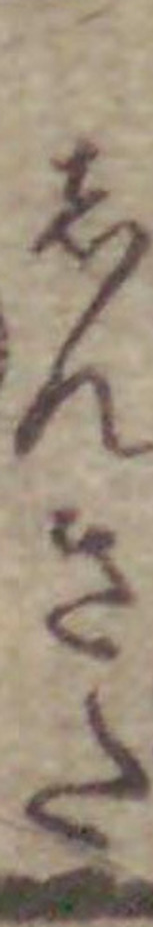しんきだ

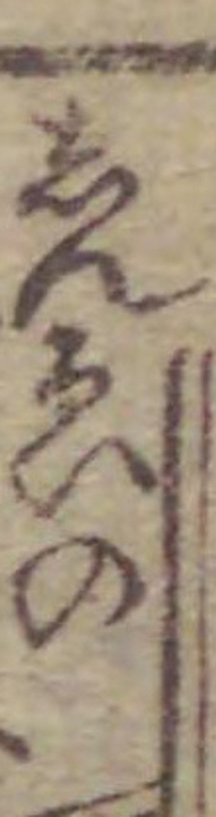しんるいの
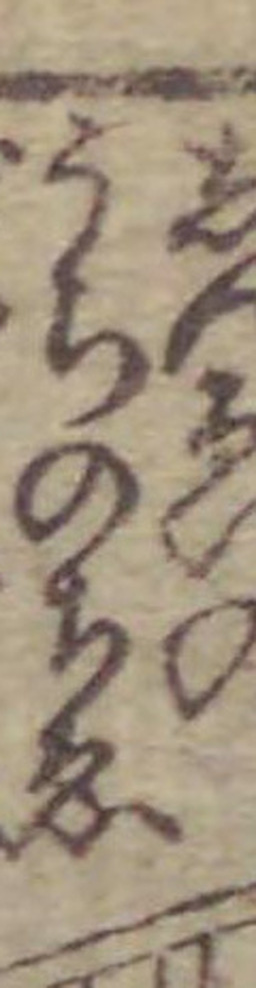うちのちゑ
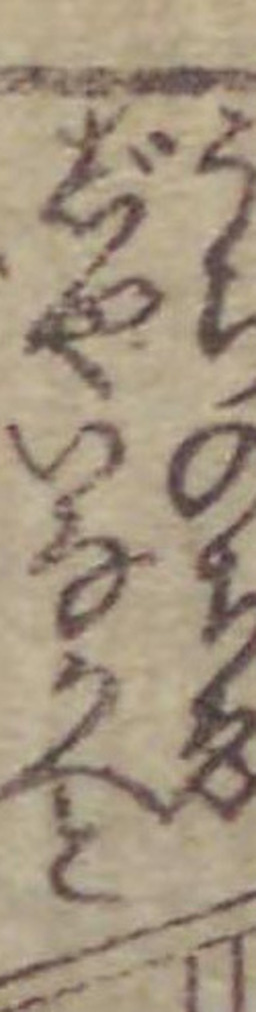じやいなかへと
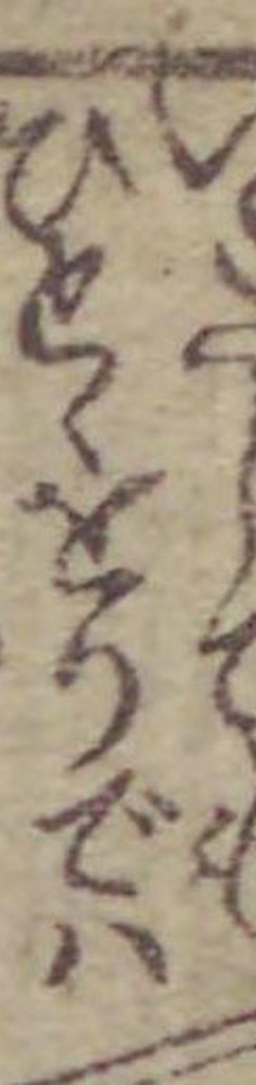ひとゝをりでは
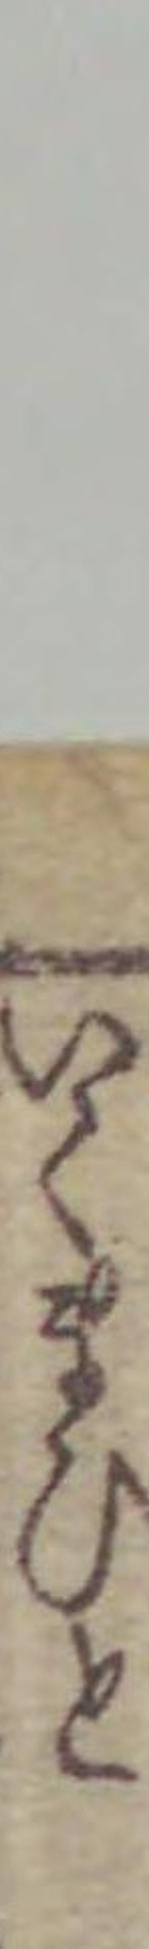いくまひと
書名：親父布子鳶握 3巻
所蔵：国立国会図書館 National Diet Library, JAPAN
